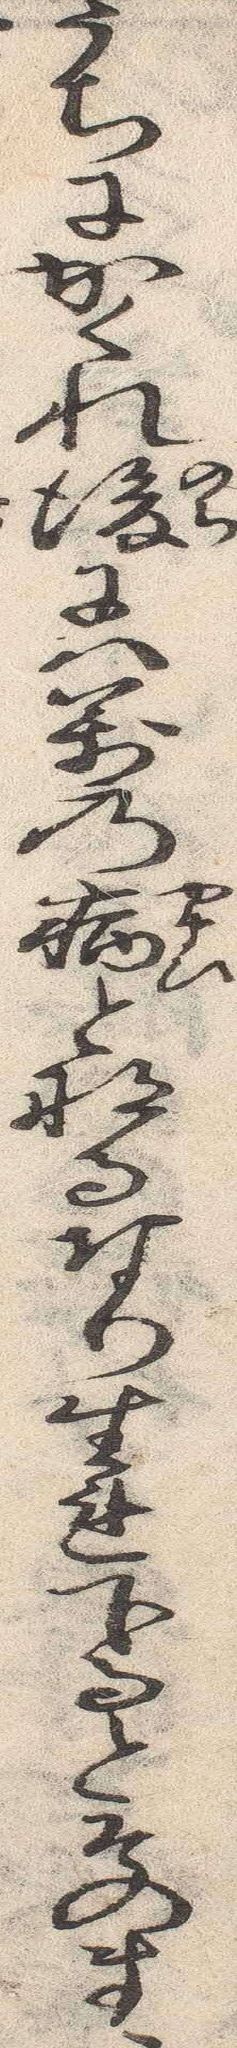うちにかくれ後には萬の病となるなり生れ下るとそのそのまゝ
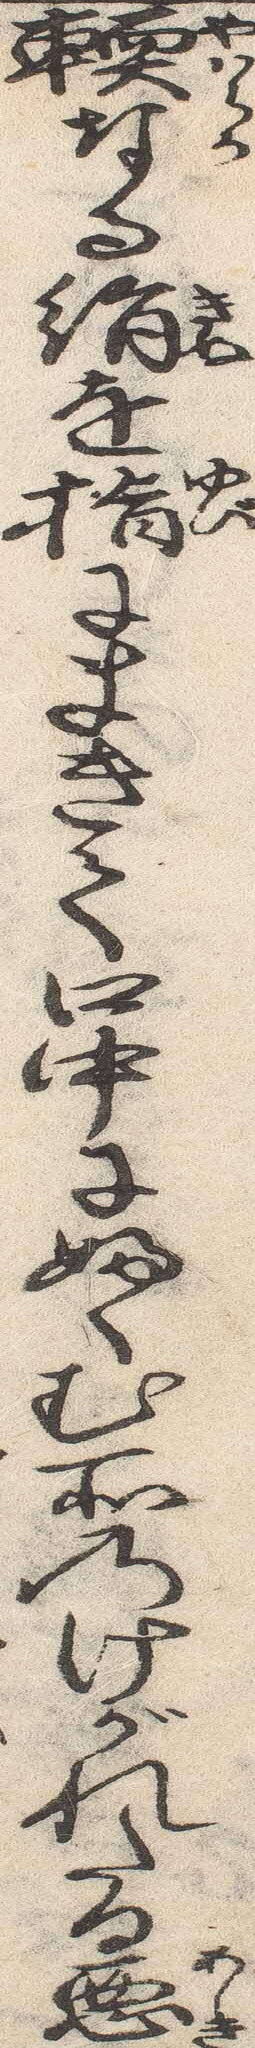輭なる絹を指にまきて口中にふくむ所のけがれたる悪
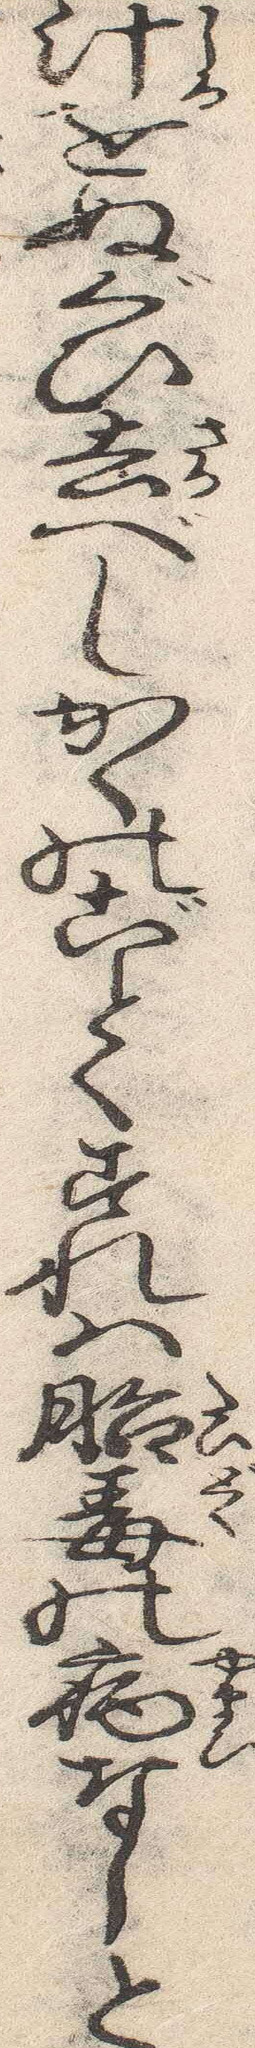汁をぬぐひ去べしかくのごとくすれは胎毒の病なしと
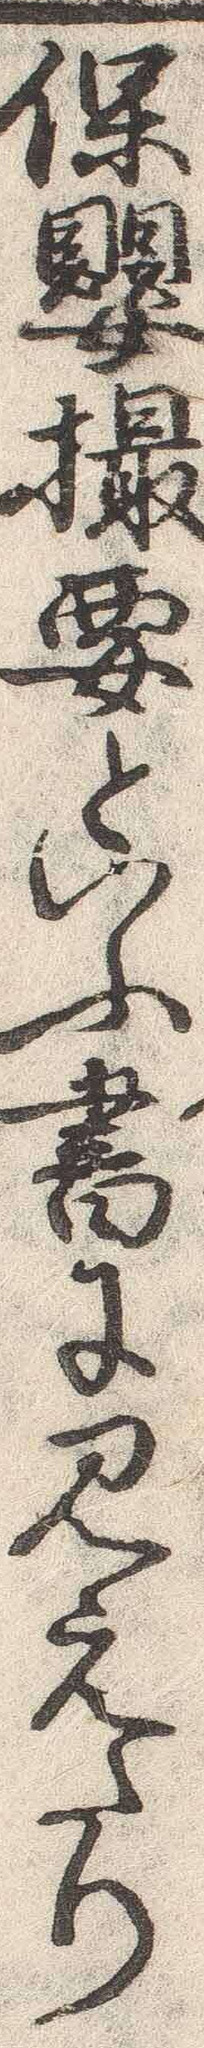保嬰撮要といふ書に見えたり
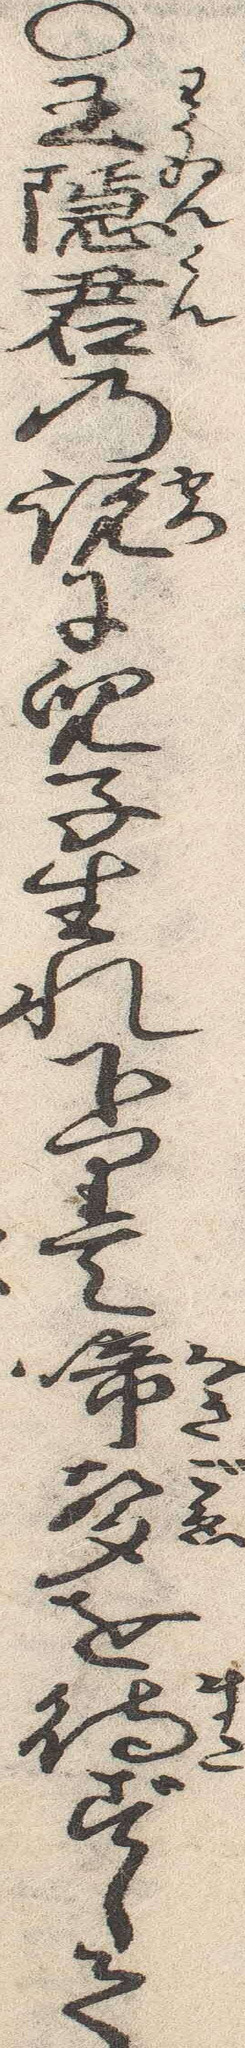◯王隱君の説に児子生れ下りて啼声を待ずして
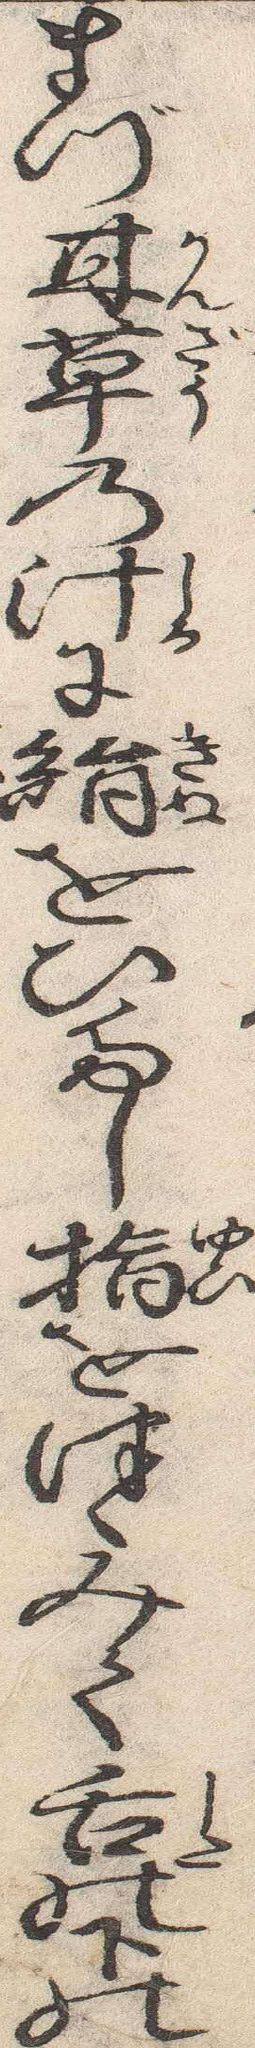まづ甘草の汁に絹をひたし指をつゝみて舌の下の
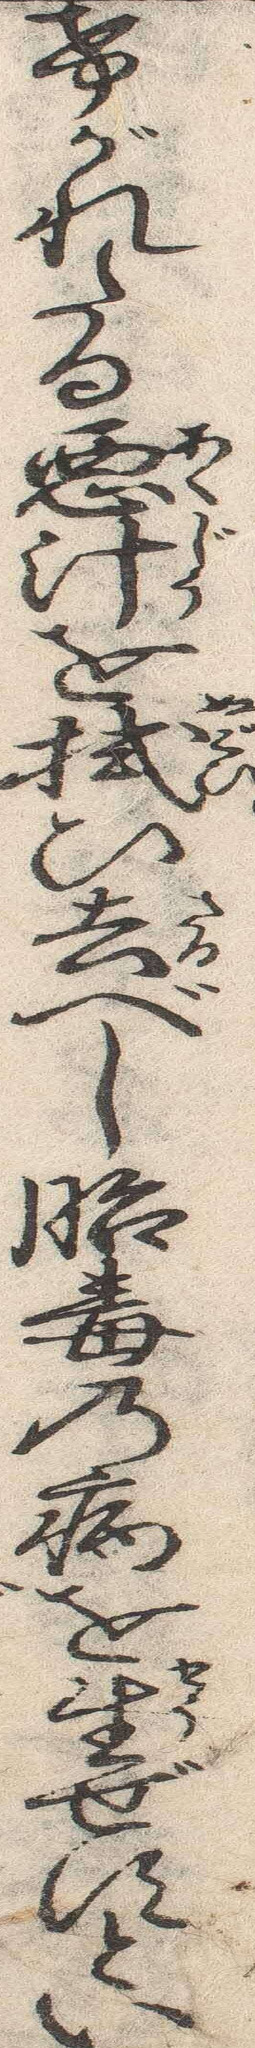けがれたる悪汁を拭ひ去べし胎毒の病を生ぜすとい
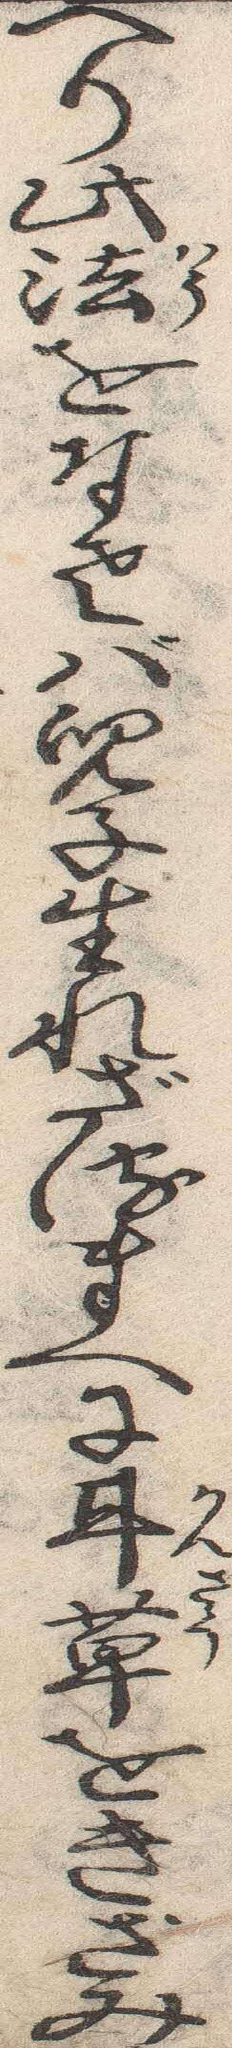へり此法をなせば児子生れざるまへに甘草をきざみ
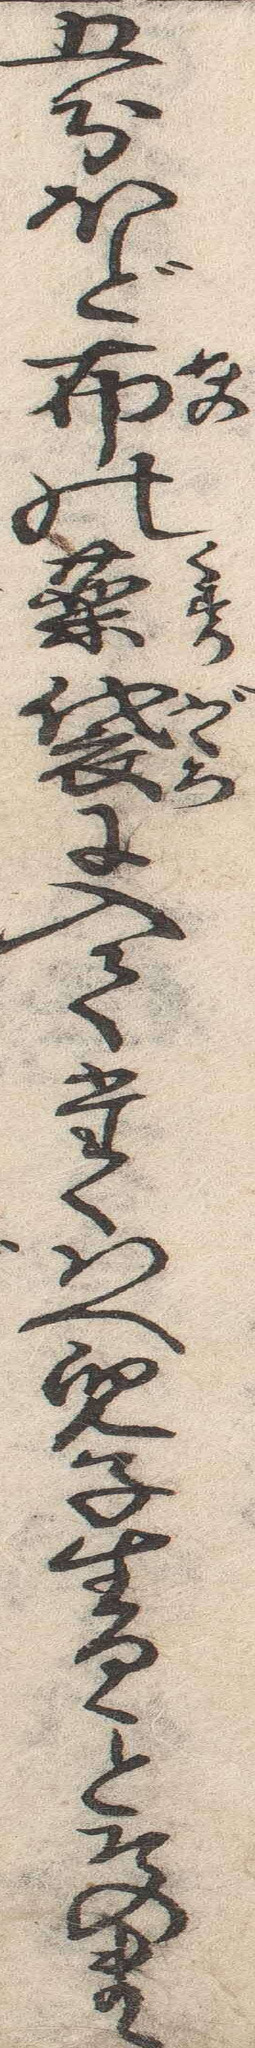五分ほど布の薬袋に入てたくはへ児子生るゝとそのまゝ
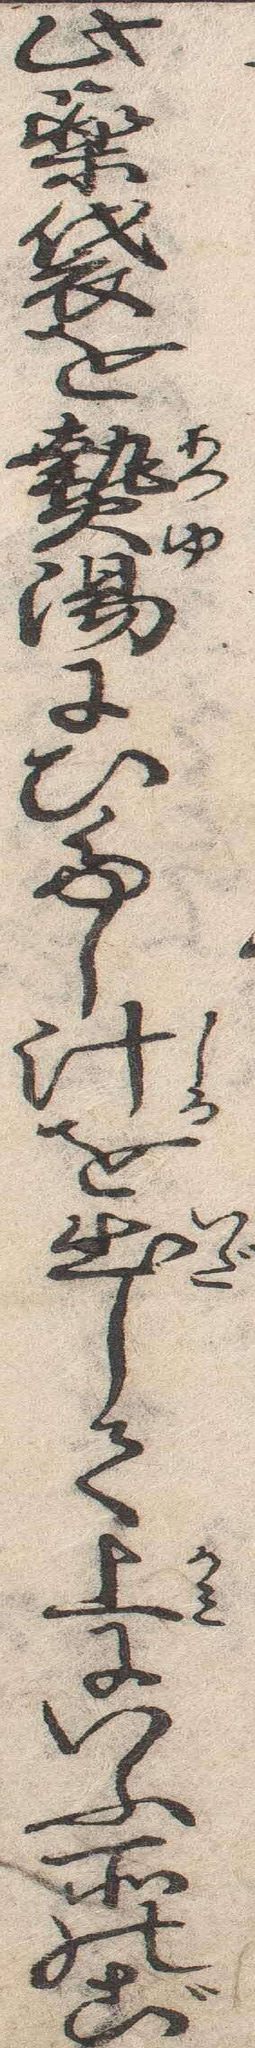此薬袋を𤍽湯にひたし汁を出して上にいふ所のご
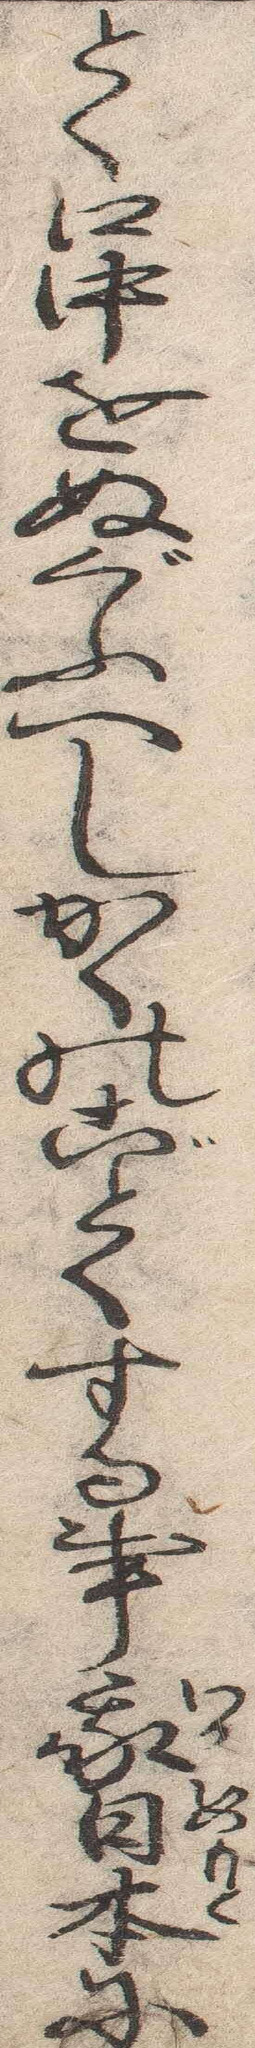とく口中をぬぐふへしかくのごとくする事我日本に

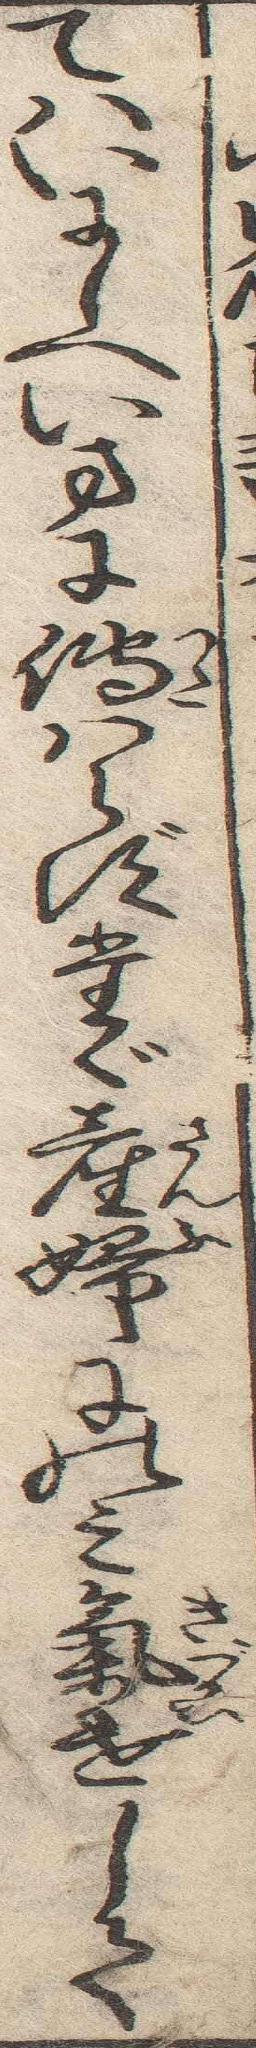てはいにしへいまに傳はらずたゞ産婦にのみ氣をして
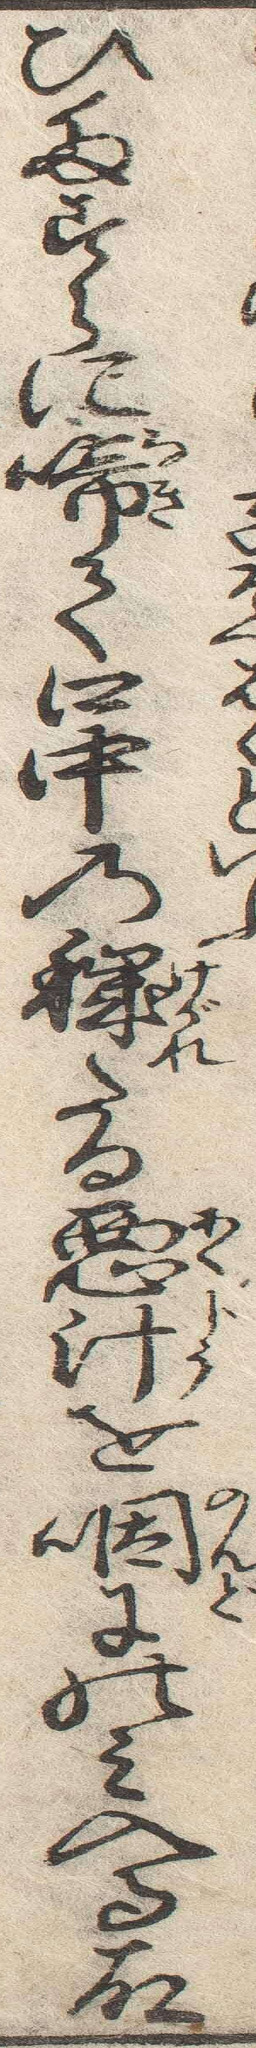ひたすらに啼て口中の穢たる悪汁を咽にのみ入る故
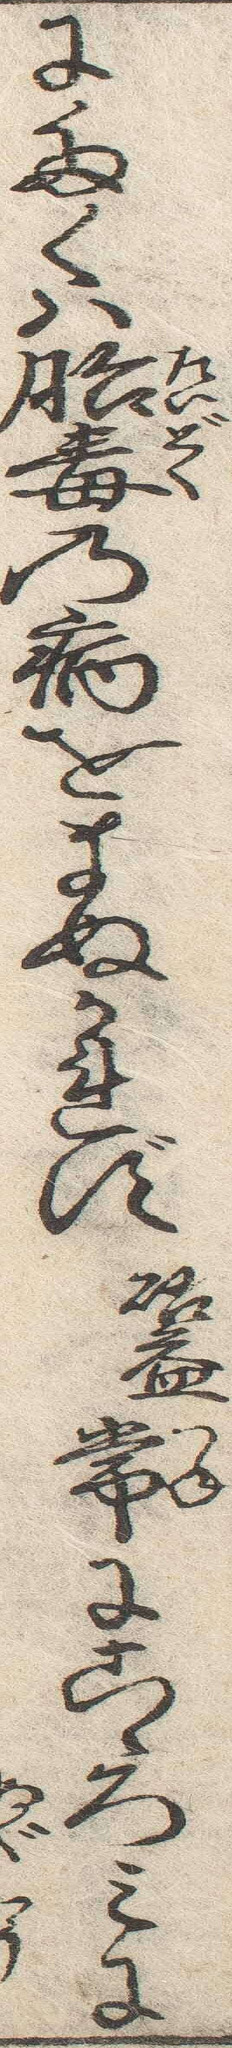に多くは胎毒の病をまぬかれず啓益常にこゝろみに
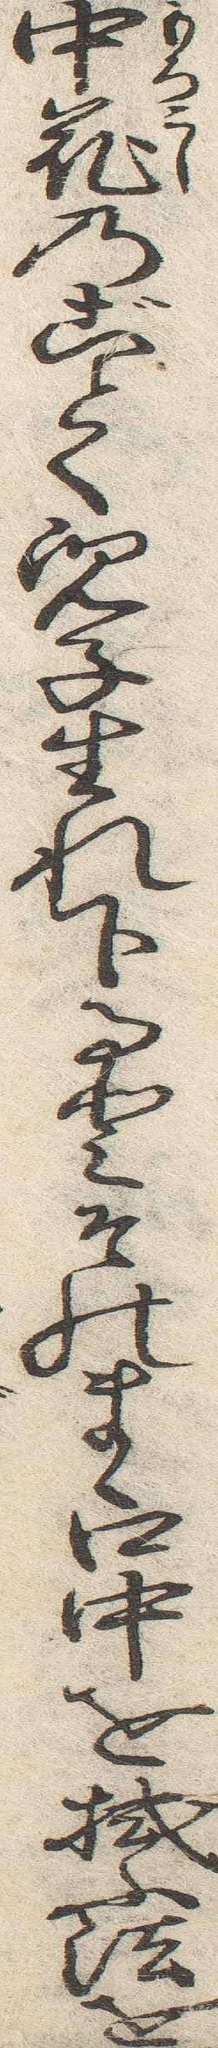中花のごとく児子生れ下るとそのまゝ口中を拭ふ法を
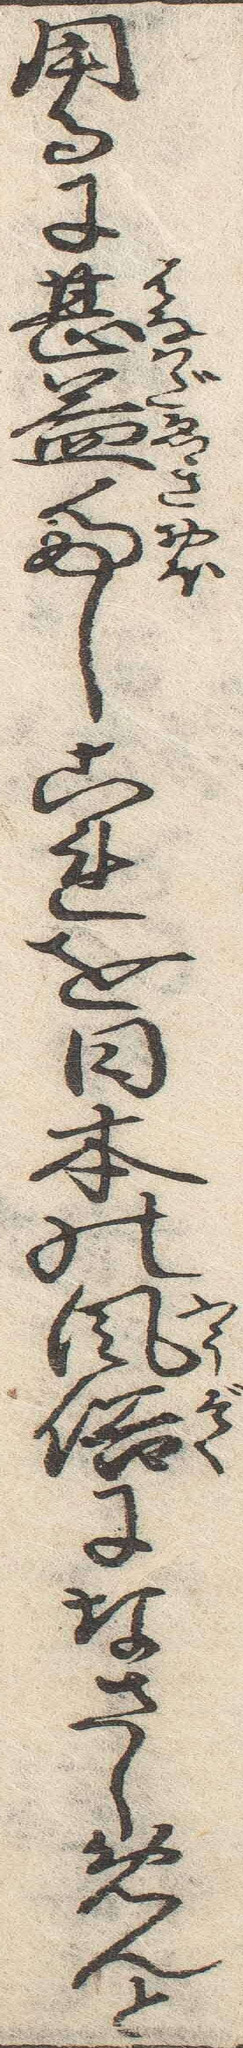用るに甚益多しこれを日本の風俗になさしめんと
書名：小児必用養育草
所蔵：東京学芸大学附属図書館 国文学研究資料館
